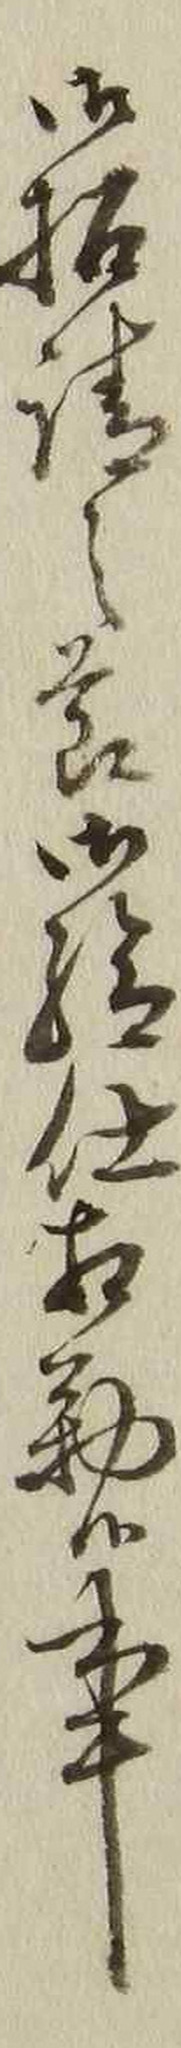御招請之節御給仕相勤候事
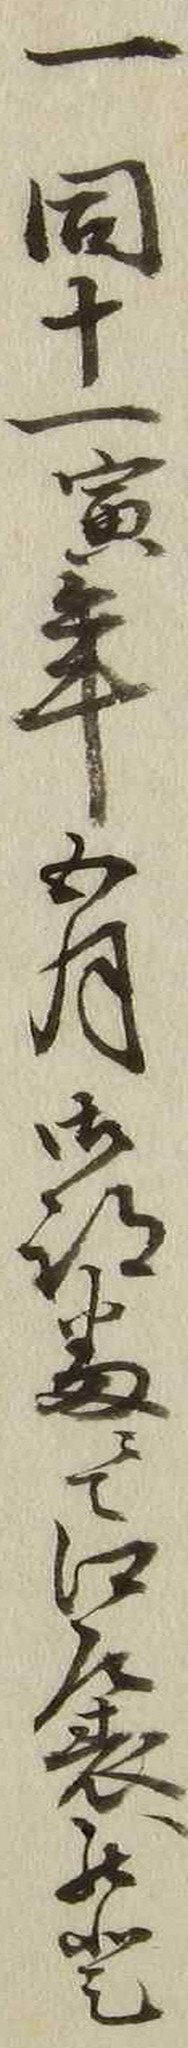一同十一寅年五月御跡番ニて江戸表へ罷登
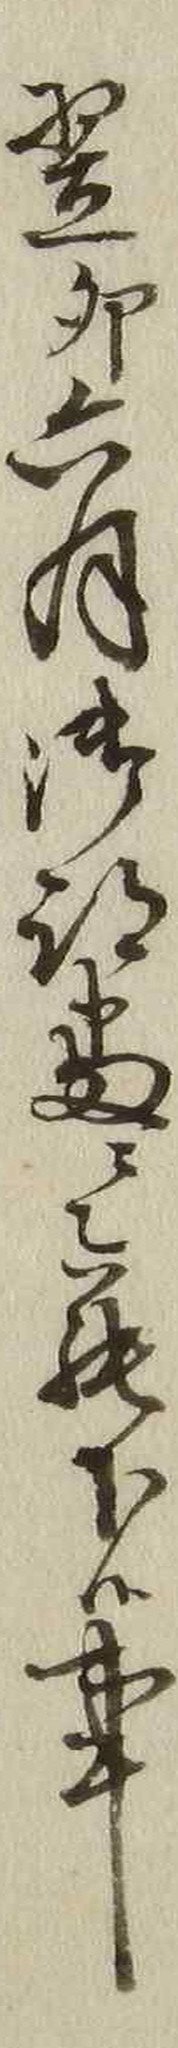翌卯六月御跡番ニて罷下候事
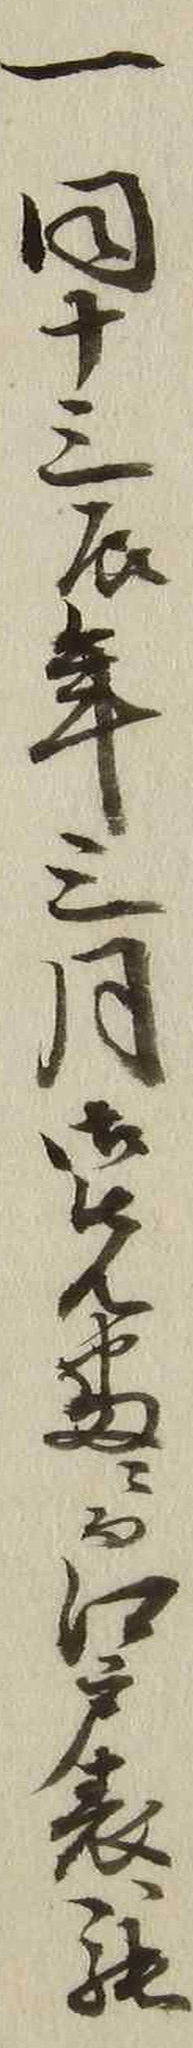一同十三辰年三月御先番ニ而江戸表へ罷
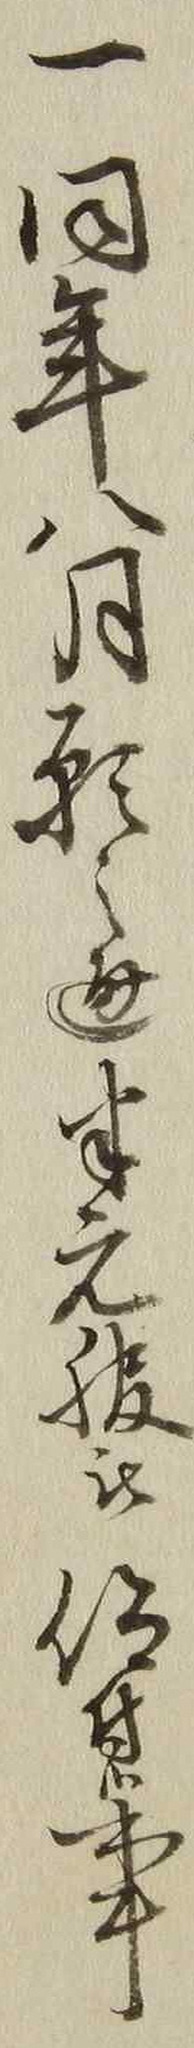一同年八月願之通半元服被仰付候事
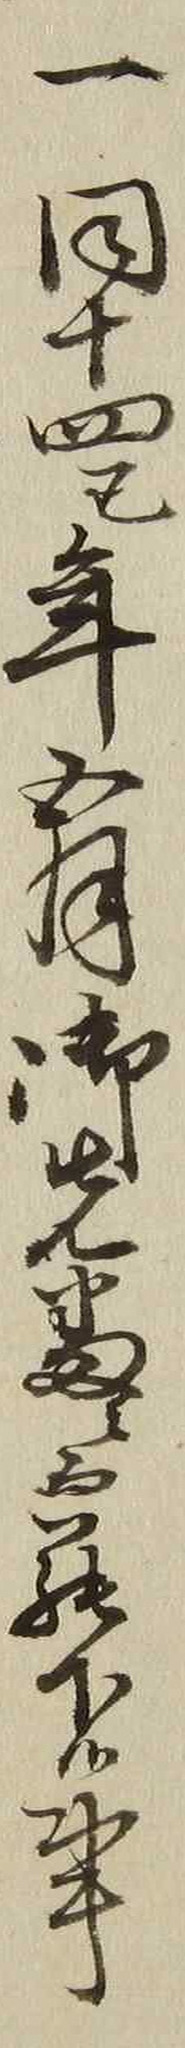一同十四巳年五月御先番ニ而罷下候事
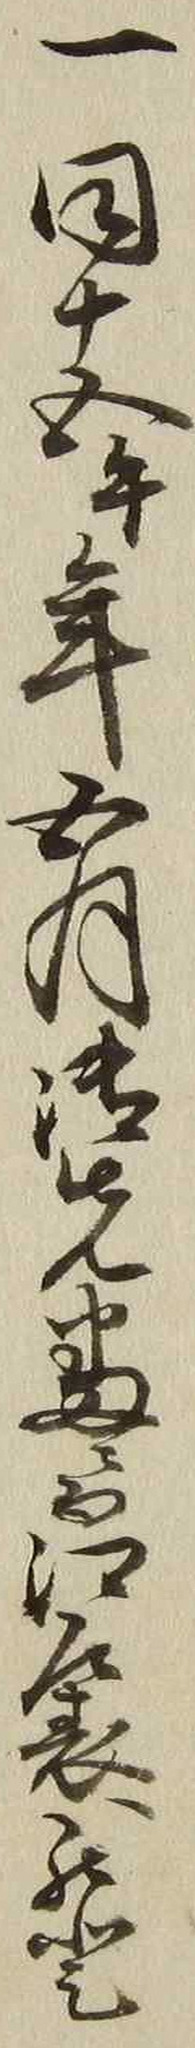一同十五午年五月御先番ニ而江戸表へ罷登
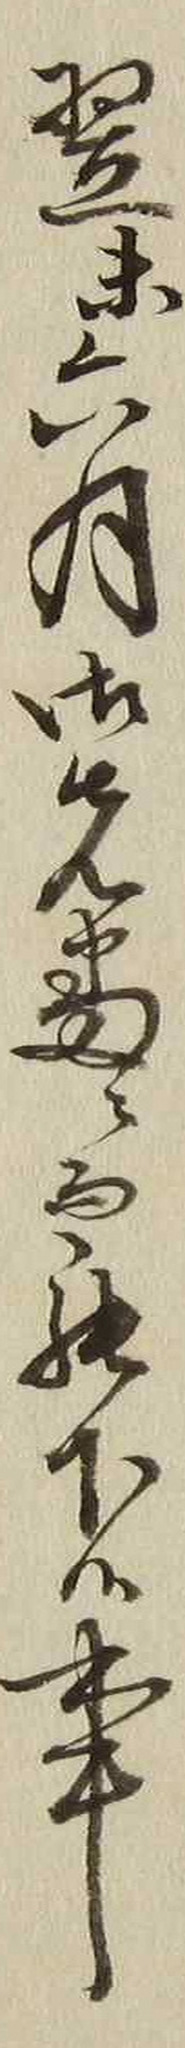翌未六月御先番ニ而罷下候事
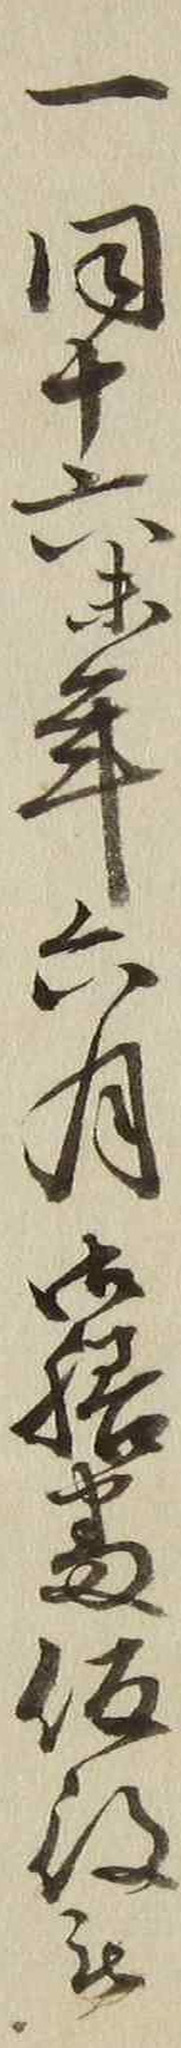一同十六未年六月御膳番仮役被
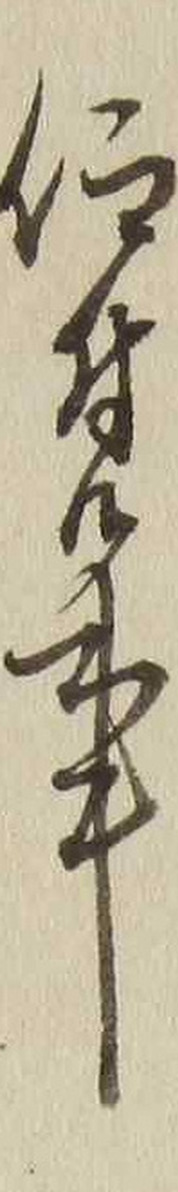仰付候事
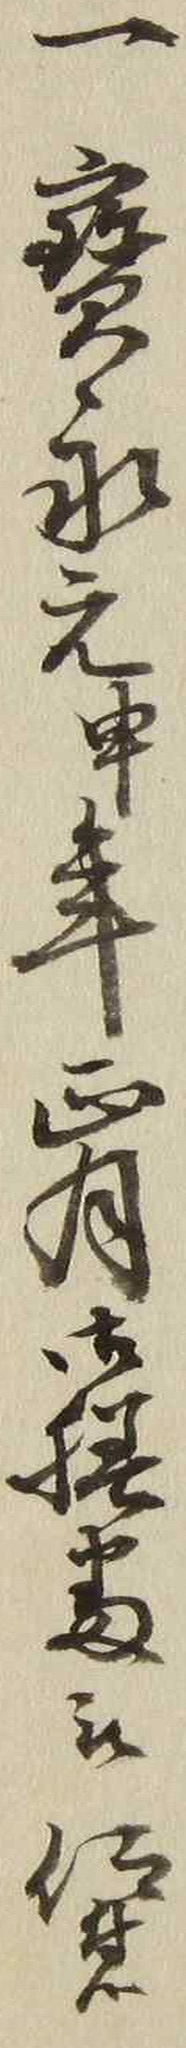一宝永元申年正月御膳番被仰付候
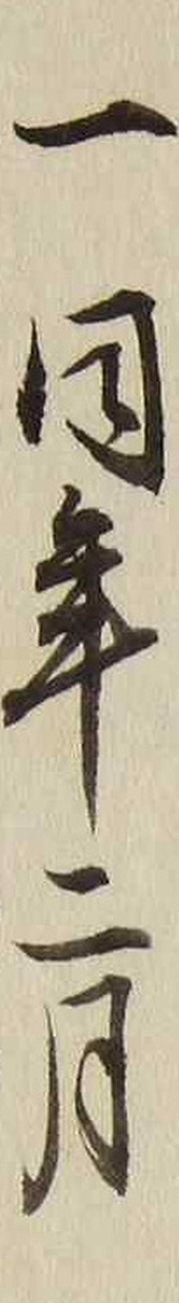一同年二月
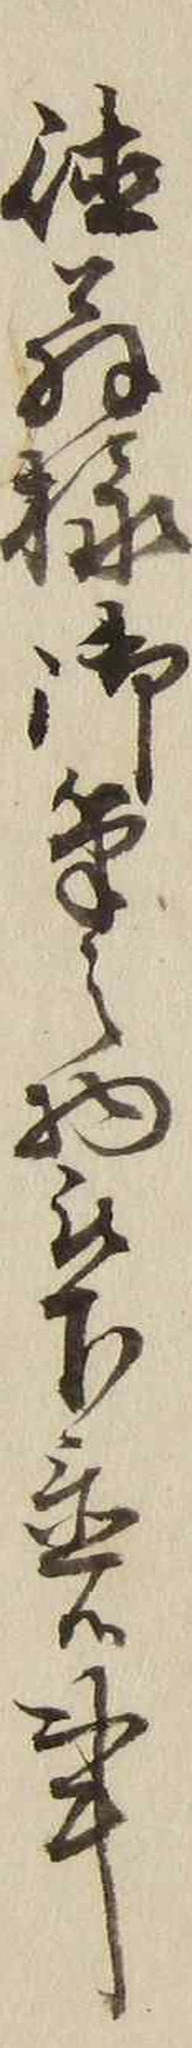徳翁様御筆之物被下置候事
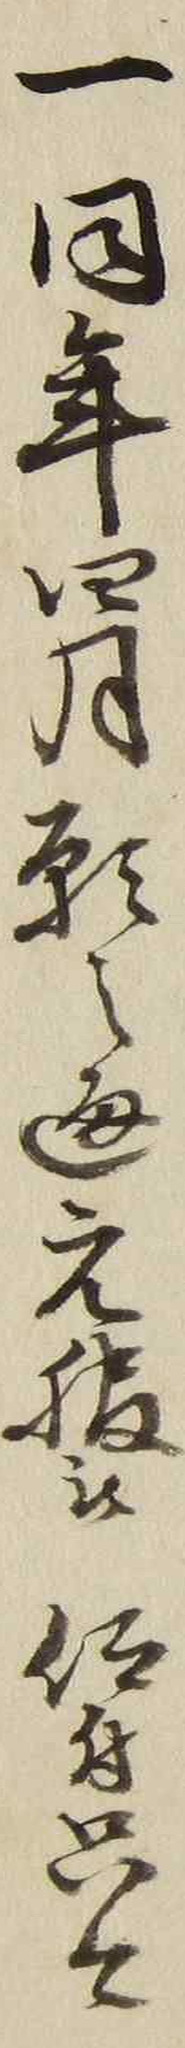一同年四月願之通元服被仰付只今

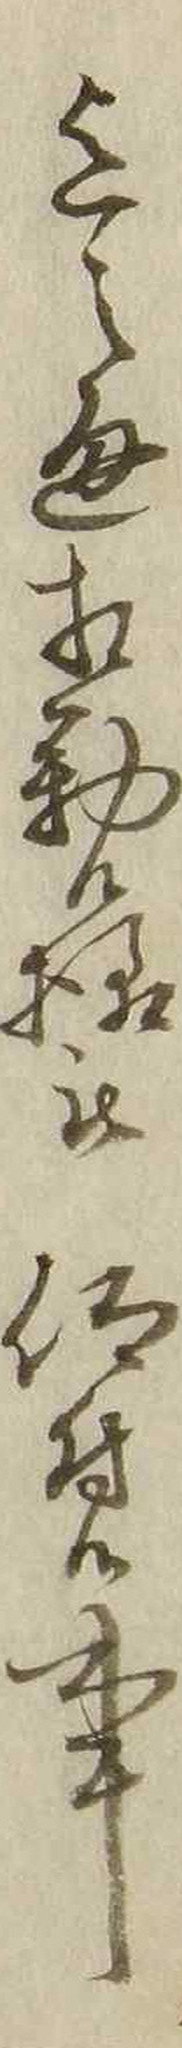迄之通相勤候様被仰付候事
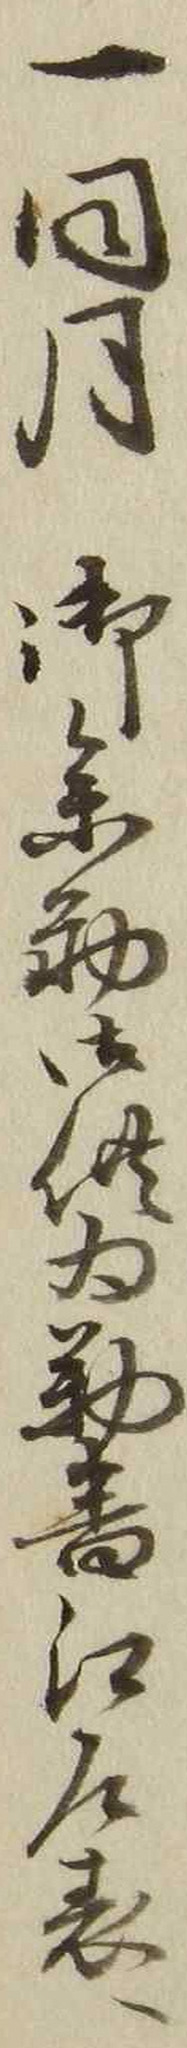一同月御参勤御供為勤番江戸表へ
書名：諸士系譜　巻之23　い之部23
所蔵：会津若松市立会津図書館
